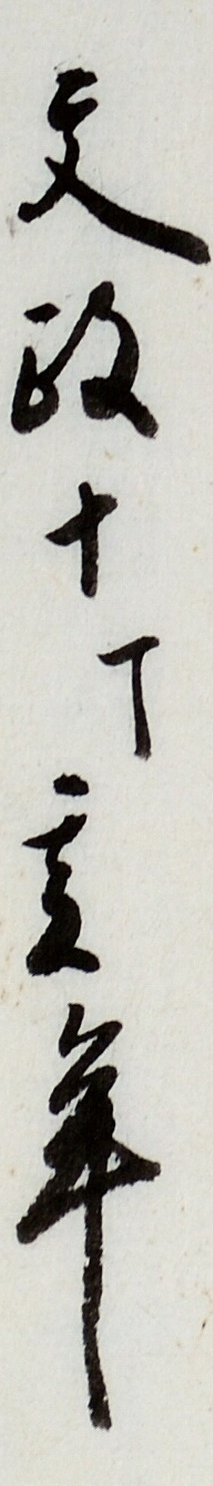文政十丁亥年
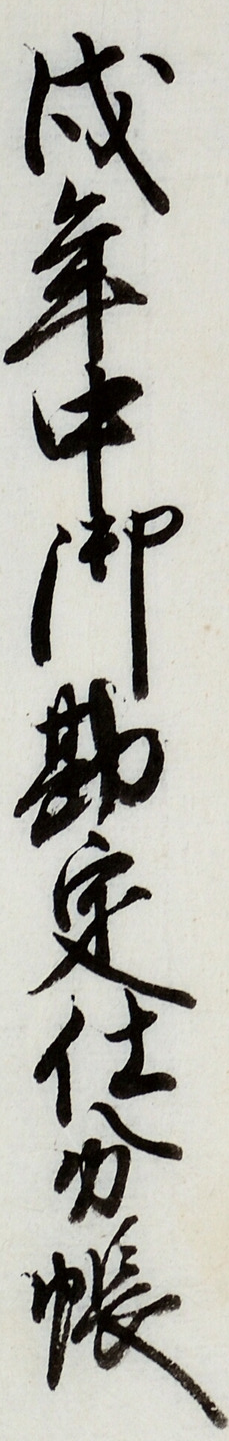戌年中御勘定仕分帳
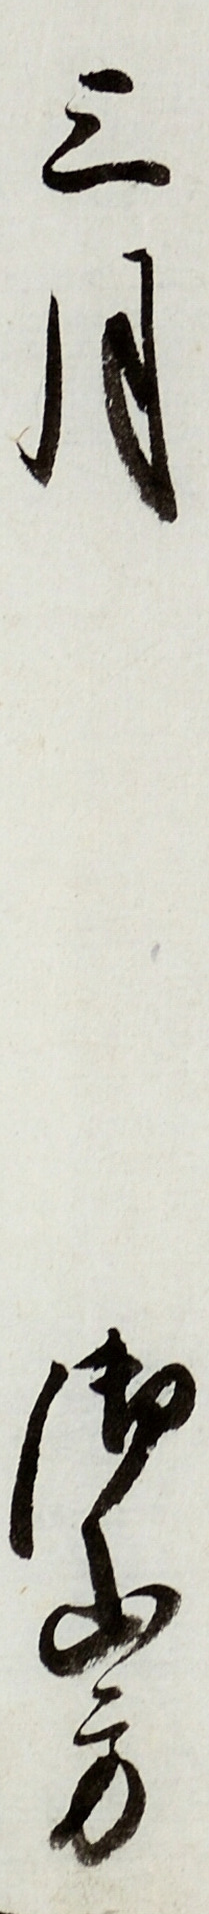三月御山方
